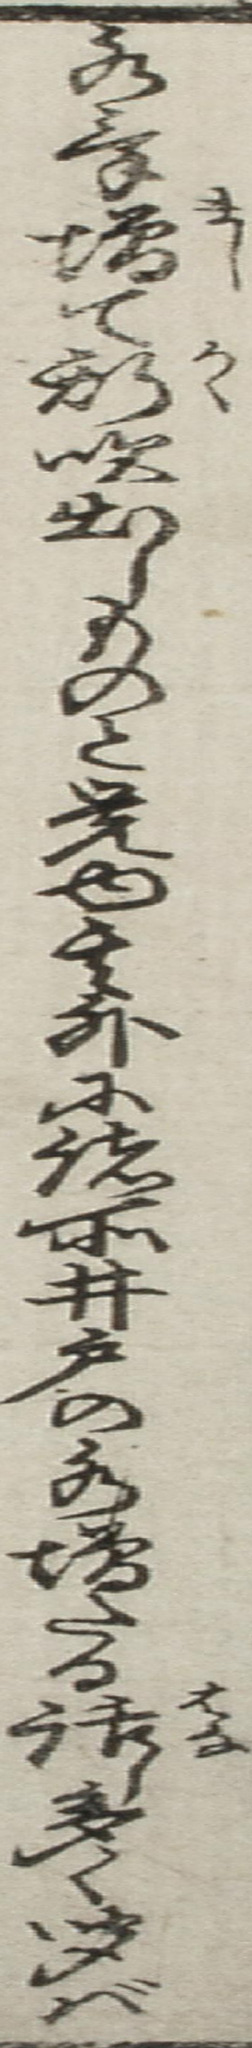水気満て斯吹出しものと覚ゆ其外に跡所井戸の水増たる話し多く聞ば
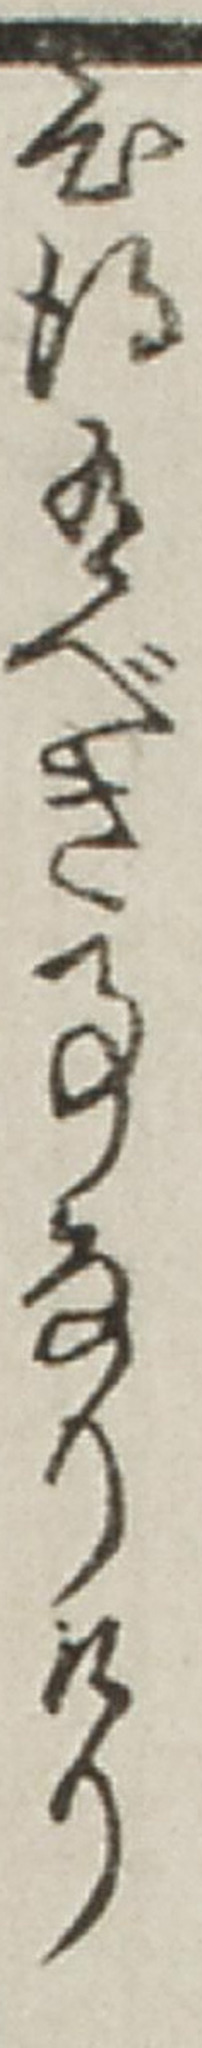心得有べき事なりけり
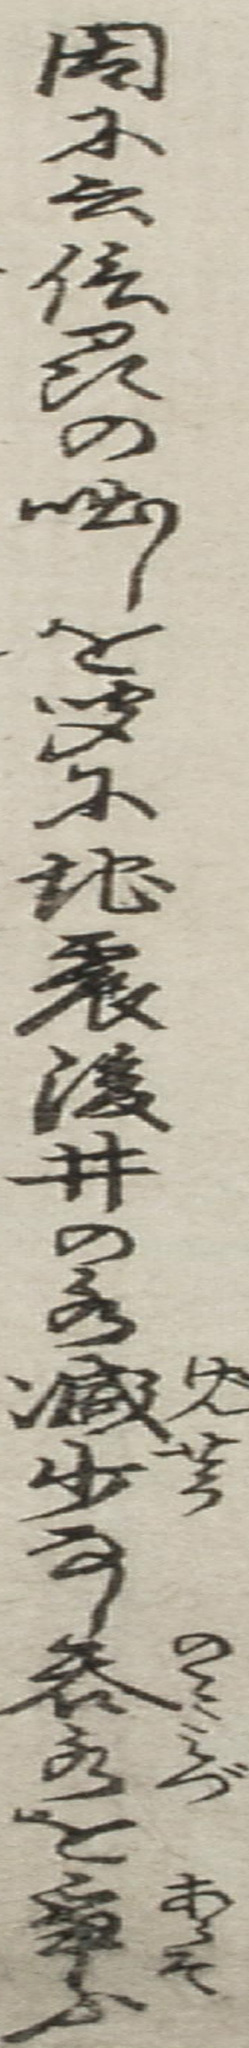因に云信州の咄しを聞に地震後井の水減少なし呑水を争う
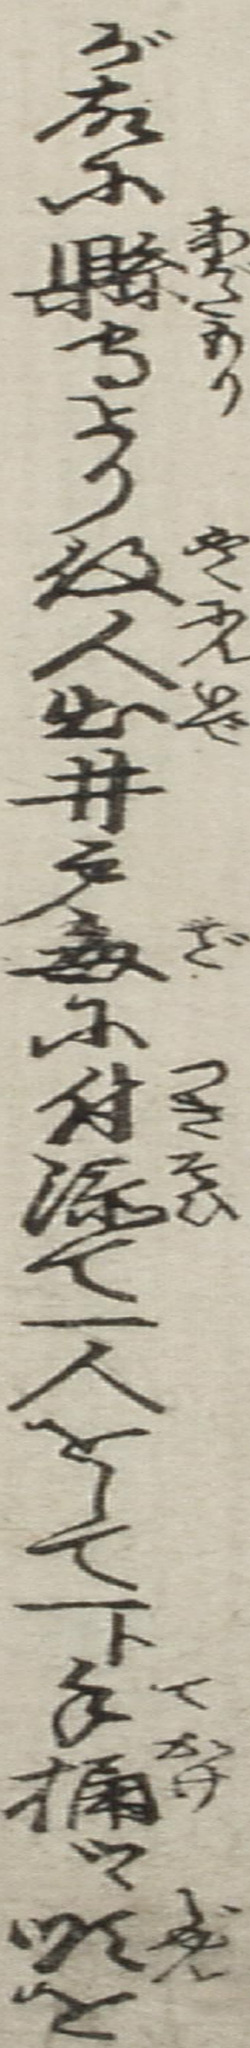が故に縣守より役人出井戸毎に付添て一人をして一ト手桶ツゝ順を
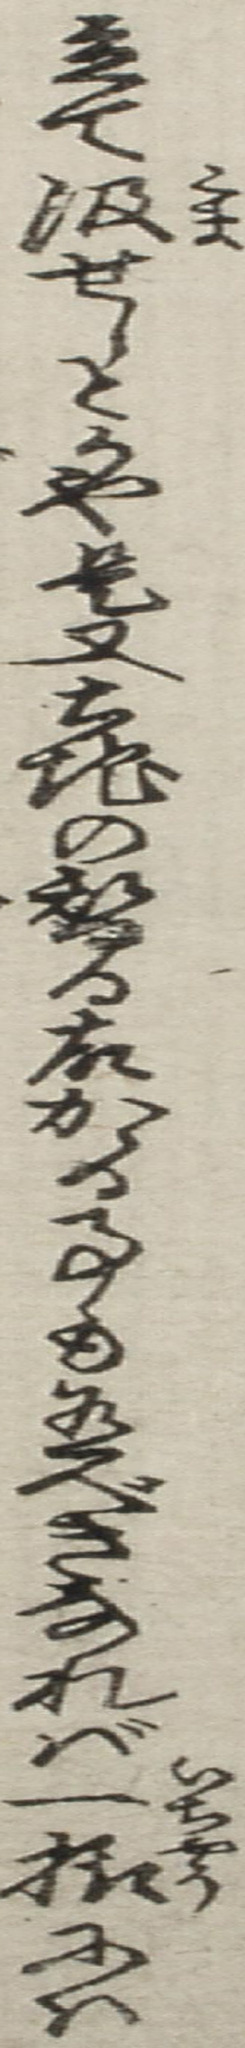立て汲せしとかや是又土地の替る故かゝる事も有べきなれば一様には
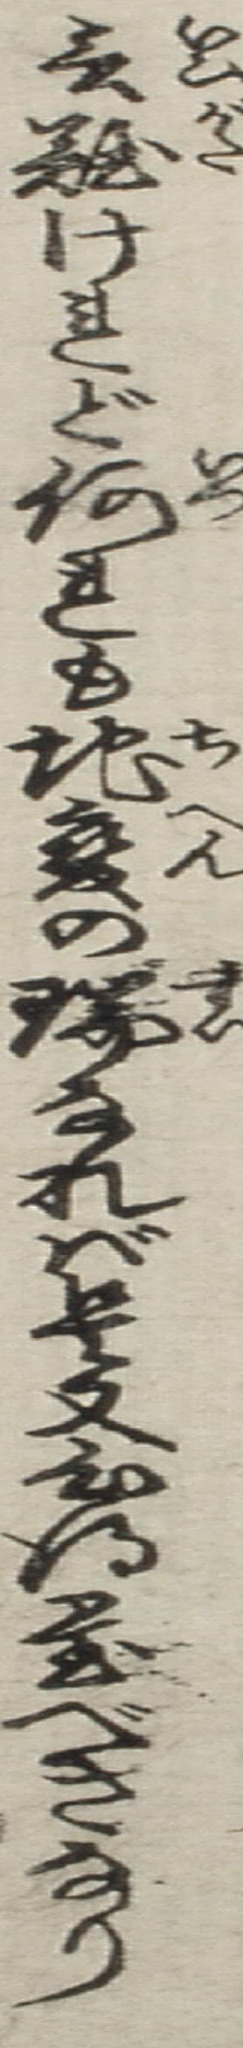云難けれど何れも地変の瑞なれば是又心得置べきなり
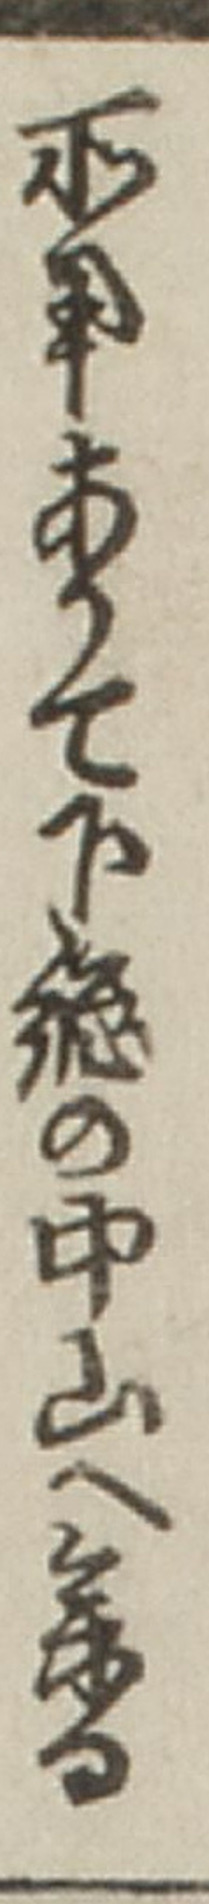所用ありて下総の中山へ参る
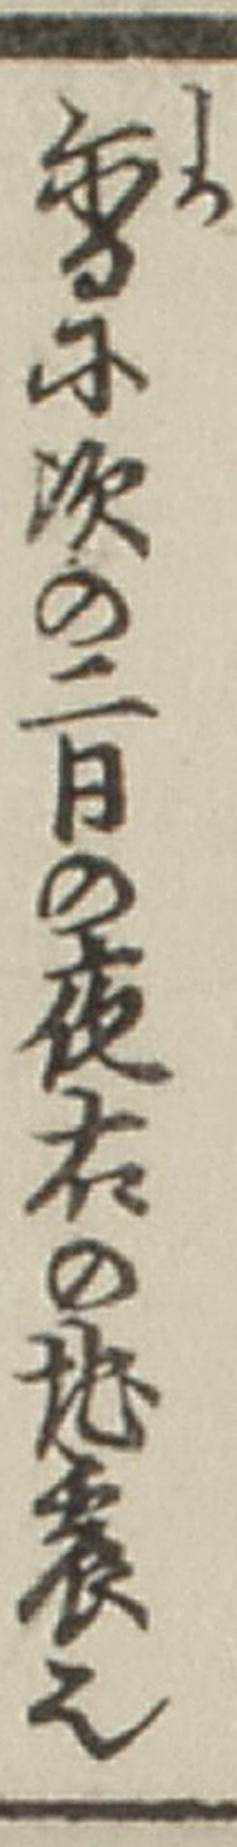尓るに次の二日の夜右の地震也
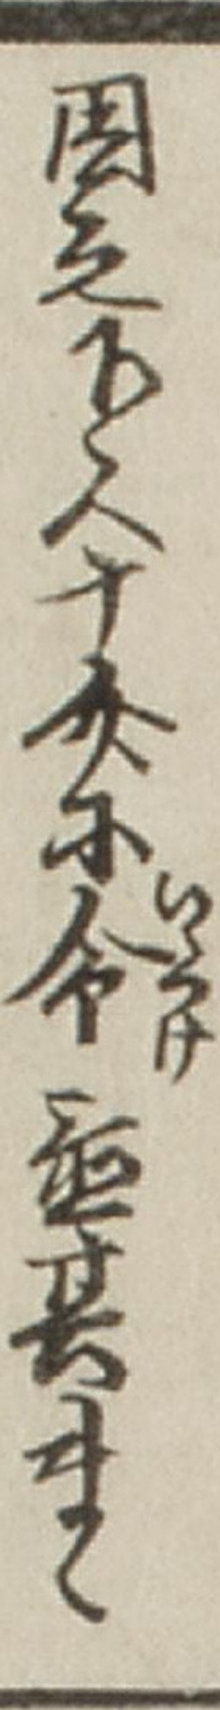因之下人十介に命置其まゝ
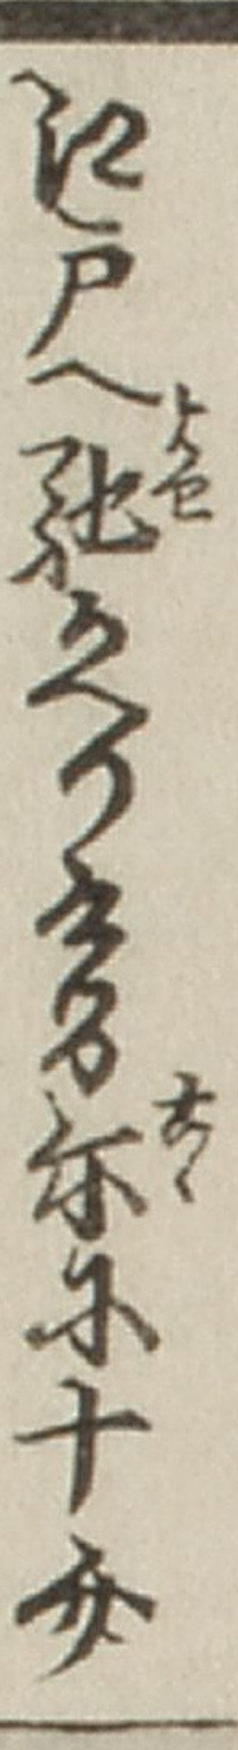江戸へ馳かへりける尓に十介
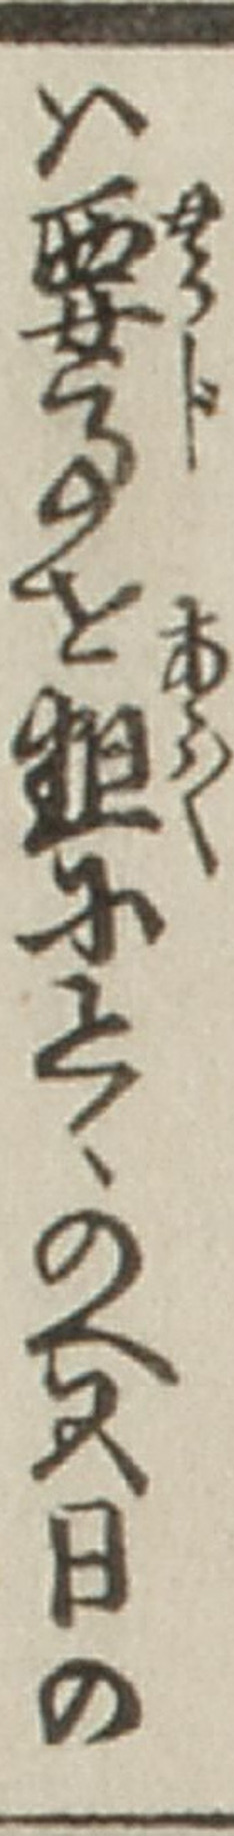は要事を粗にとゝのへ五日の
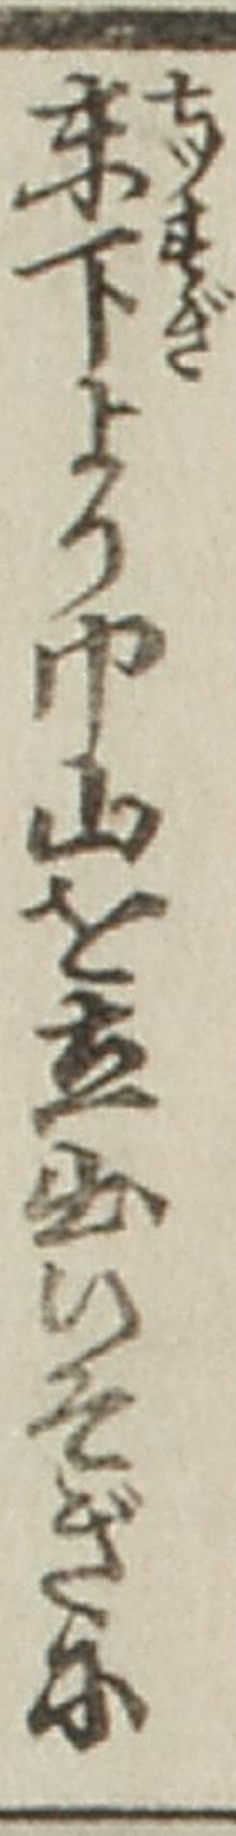未下より中山を立出いそぎに
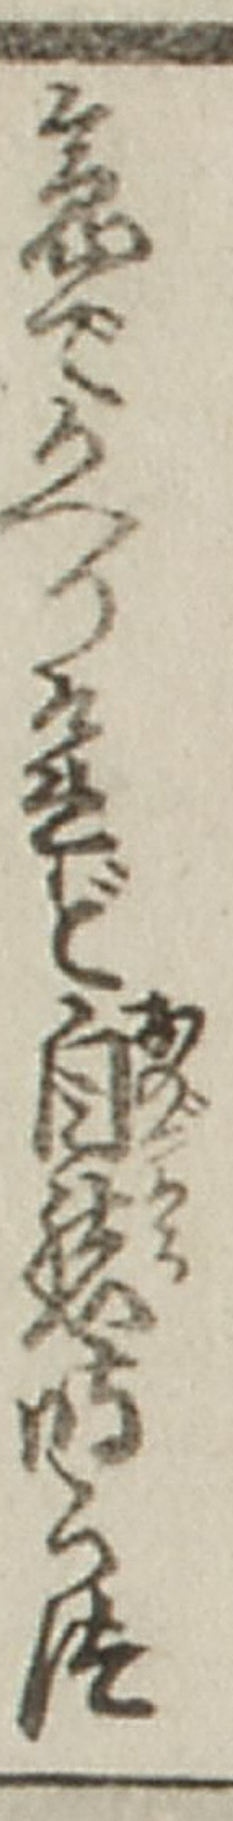急でかへりけれど自然時うつ
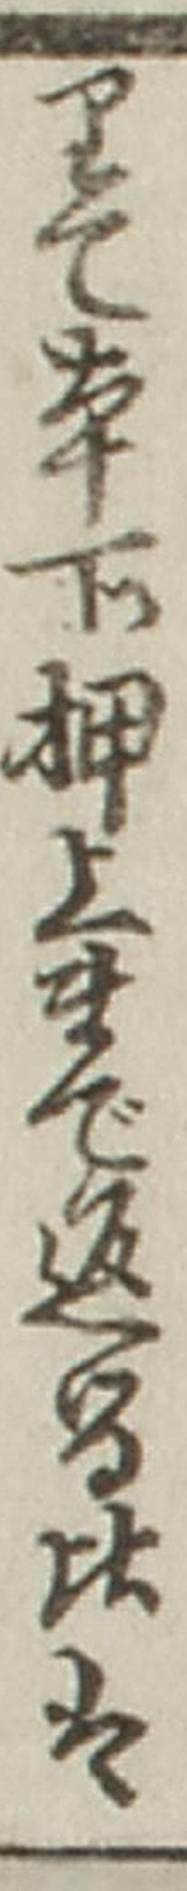りて本所押上まで返る比は
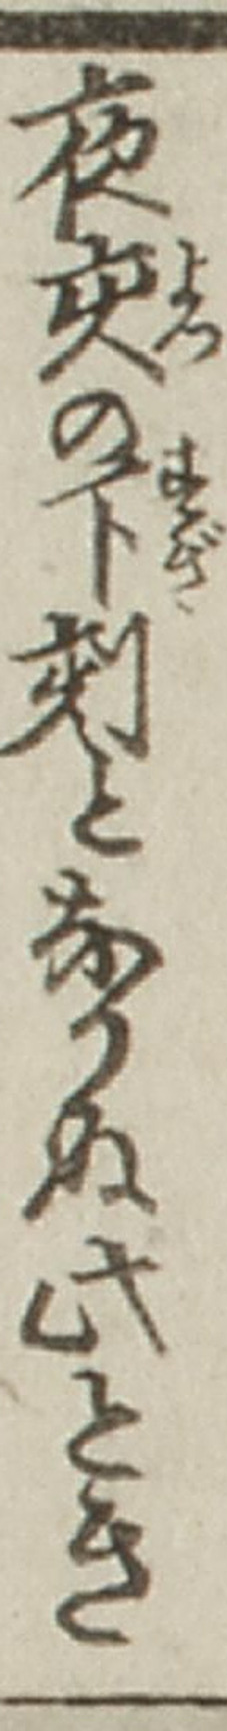夜亥の下刻となりぬ此とき
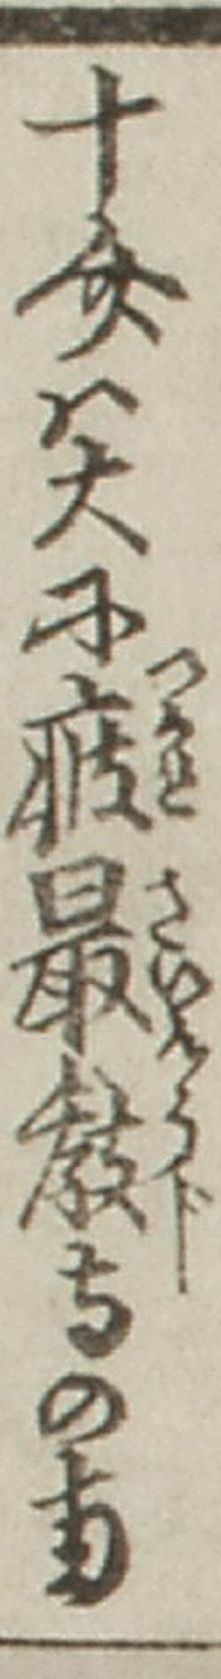十介は大に疲最教寺の南
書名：安政見聞誌　下
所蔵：東京大学地震研究所図書室 Earthquake Research Institute Library, The University of Tokyo, JAPAN
